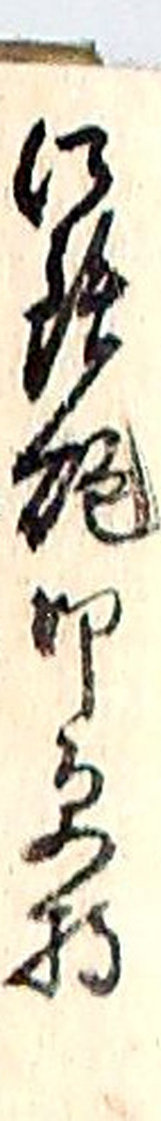郷鉄炮御受持
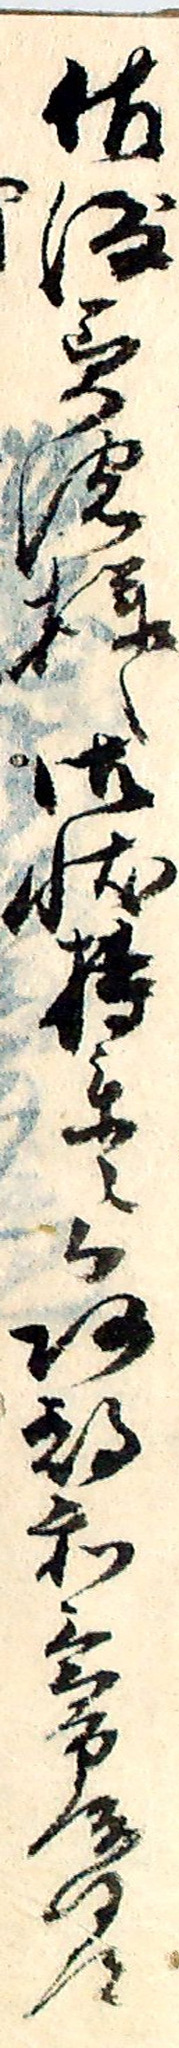佐渡美濃様へ御状持参にて阿部和三郎殿同道
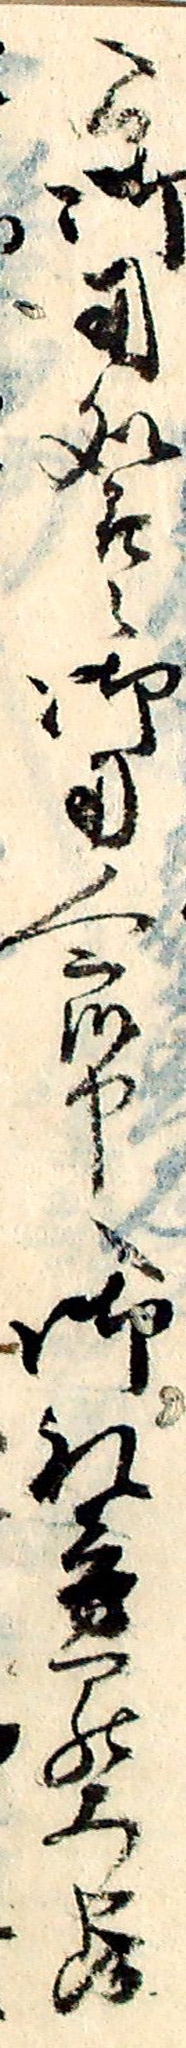にて御用処并に御用人衆中へ御礼旁罷上申候
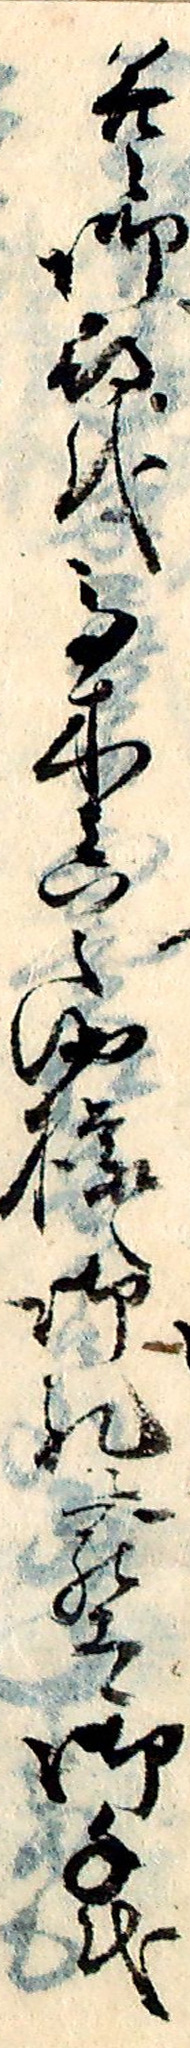并に御郡代高木真之助様へ御礼に罷上候御手代
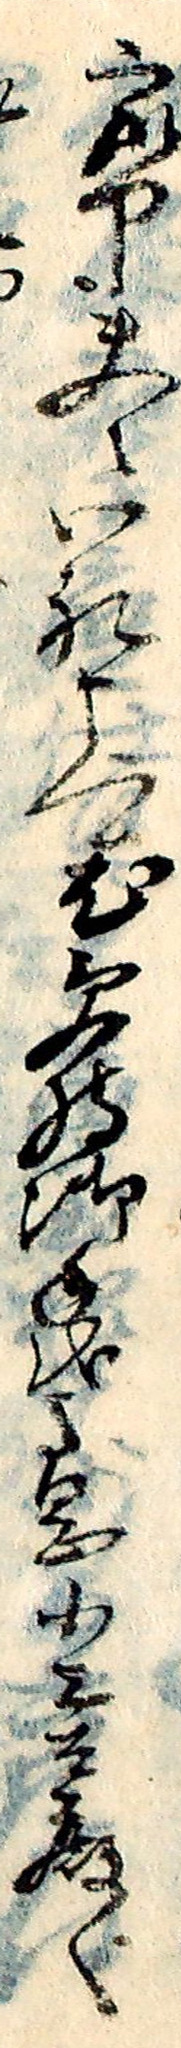衆中夫々御礼申上候尤受持御手代高岡小三太殿へ
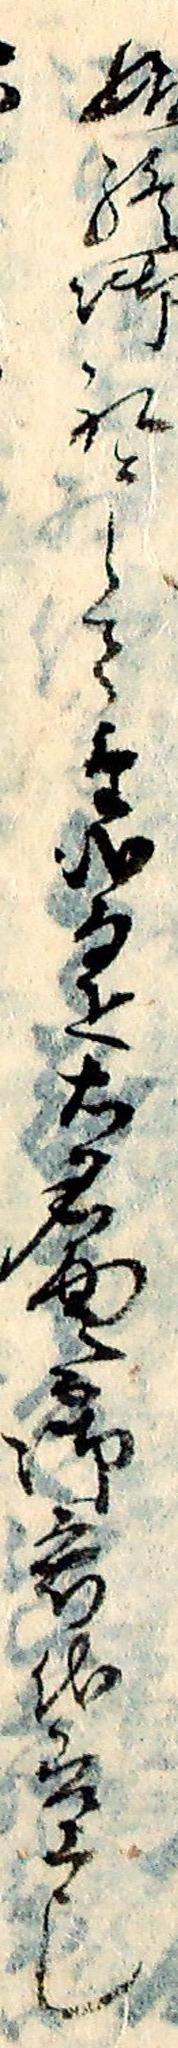始終御礼として金弐百疋右名面にて御肴代差上申候
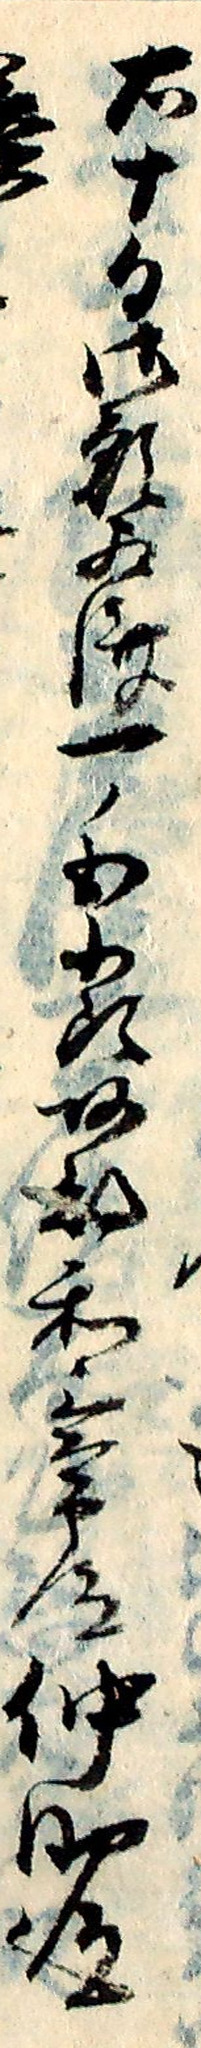右十日御願相済一ノ宮小頭阿部和三郎殿仲助殿
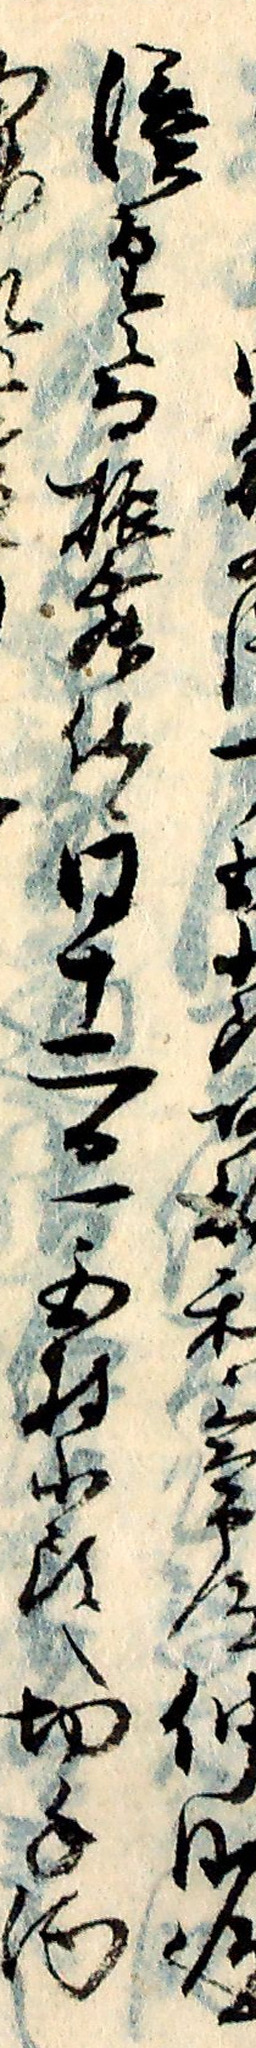湊金にて振舞仕候同十二日一宮村小頭へ切手酒
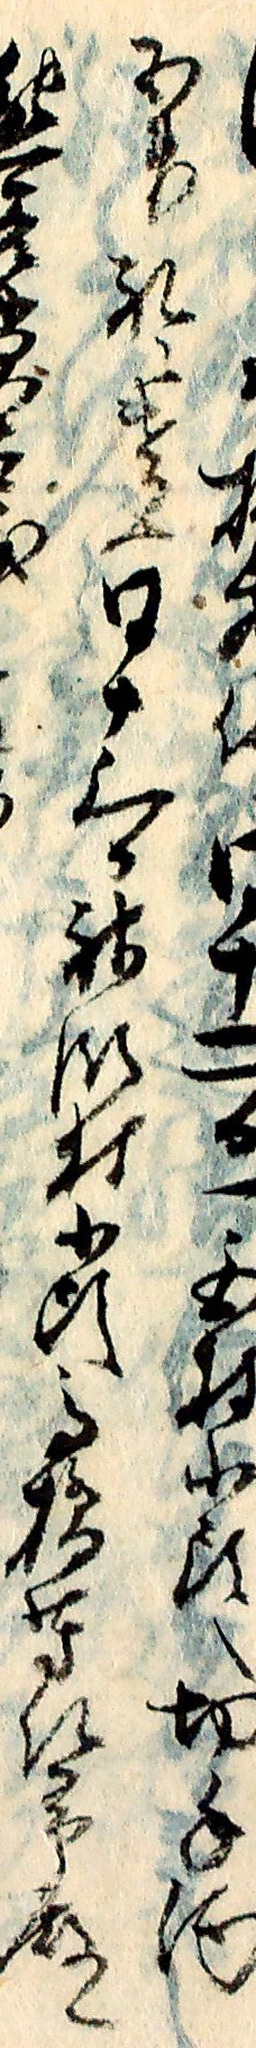五升礼に遣候同十三日神領村小頭高橋芳次郎殿へ
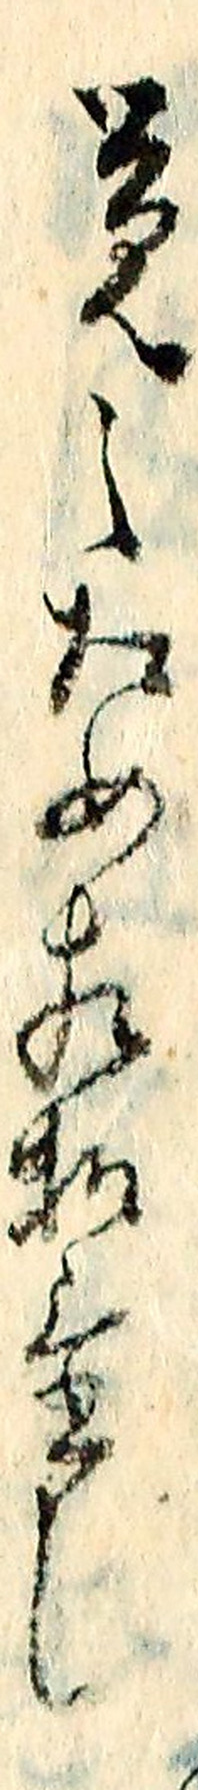覚之ため相扣置申候
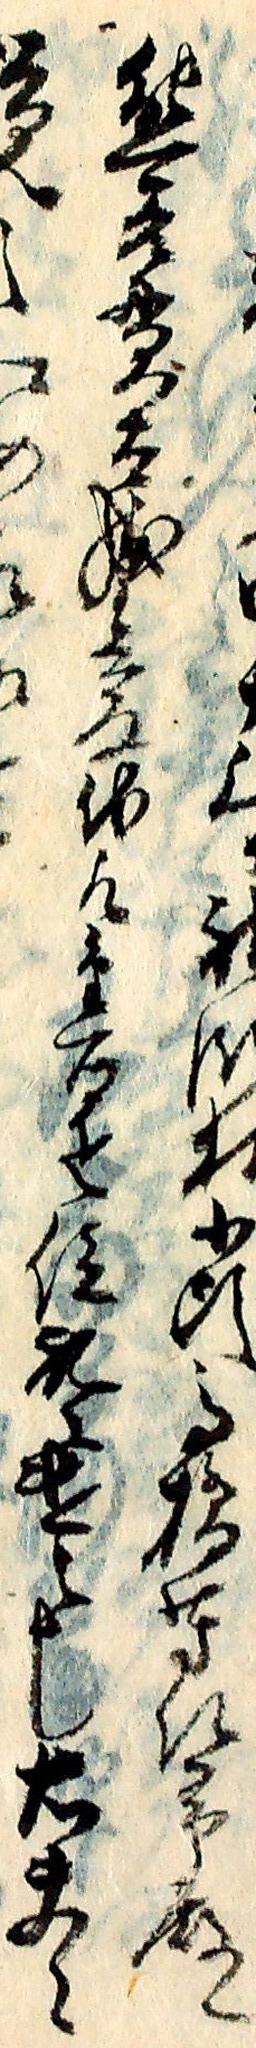熊善貫太織壱反代凡金百疋位礼に遣し申候右夫々
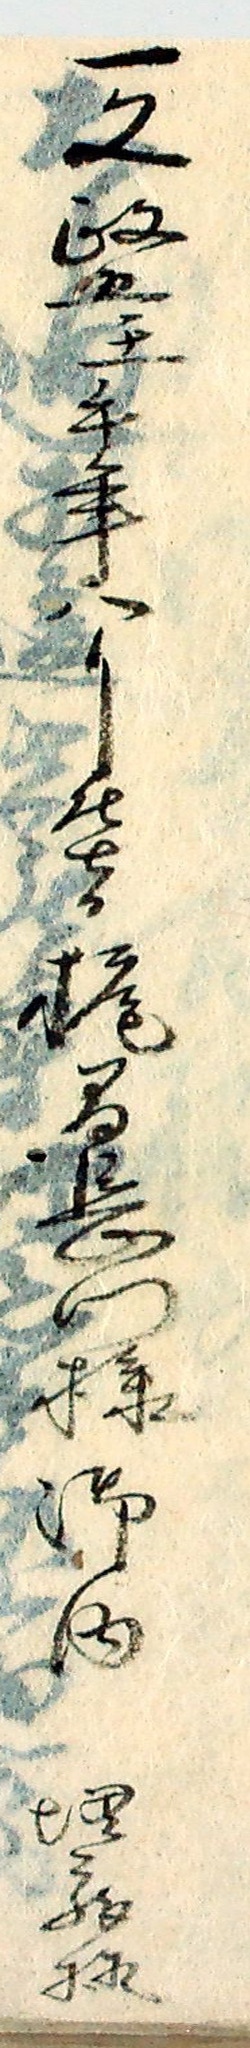一文政五壬午年八月廿七日梶間長門様御内増蔵様

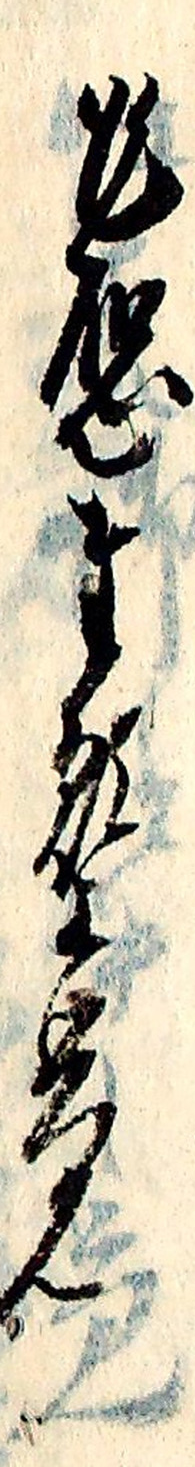乍恐奉願上覚
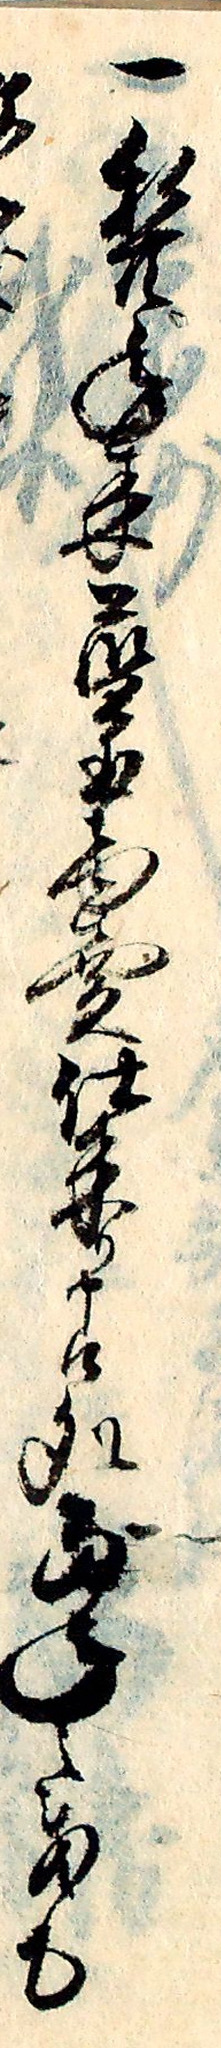一私共年来藍玉商売仕来り申候処当年之義も
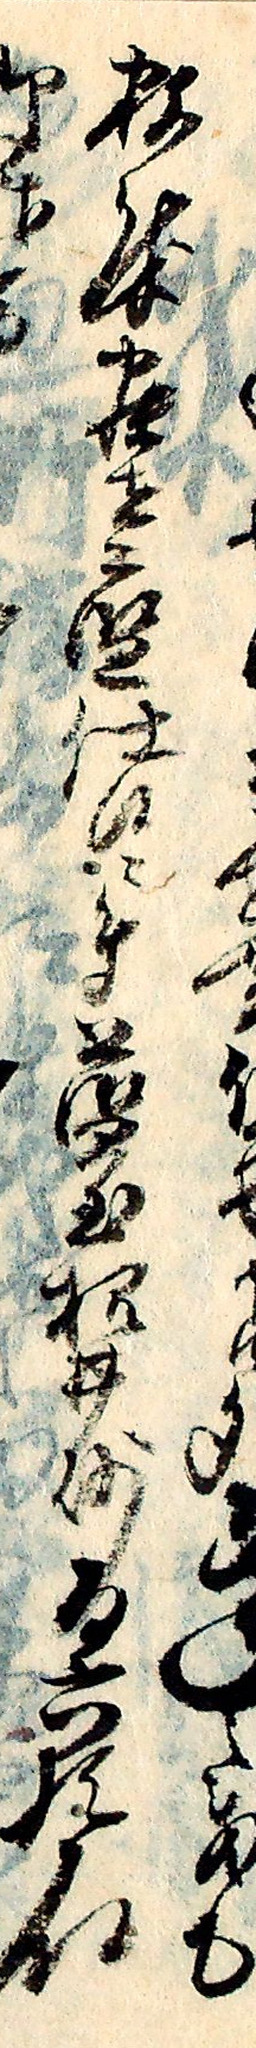数床寐せ藍仕候に付藍玉根井砂百六拾石
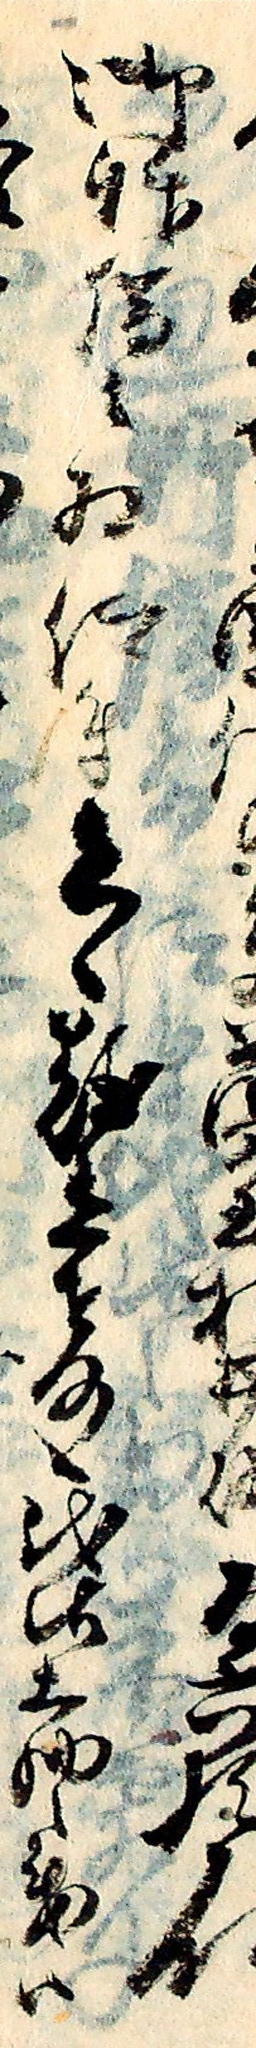御拝借被為仰付候はゝ難有奉存候代銀筋之義は
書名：諸御願書控(後藤氏壱番）
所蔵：鳴門教育大学 Naruto University of Education
